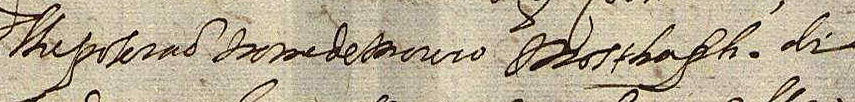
lhe poseraõ nome de mouro Mosthaph. di
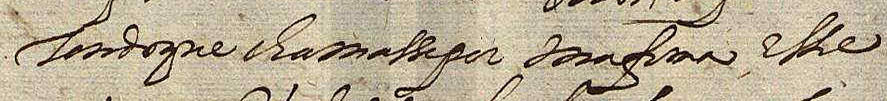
zendo que chamasse por Mafoma, E lhe
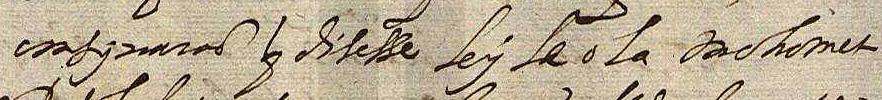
emsynaraõ q̄ disesse Ley Le o La mohomet
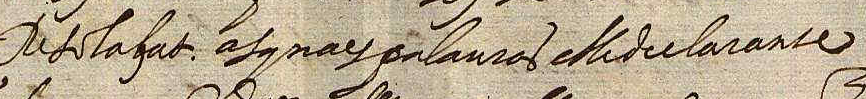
Resolahat. as quaes palauras elle declarante
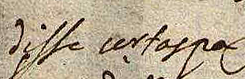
disse certas pa
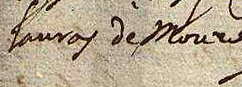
lauras de Mouro
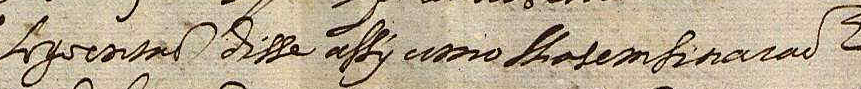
logo entaõ disse assy como lhas emsinaraõ
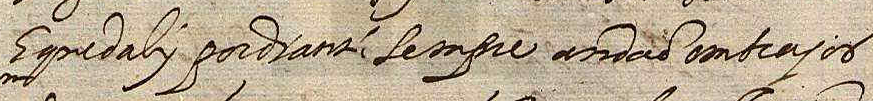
E que daly por diante sempre andaõ em trajos
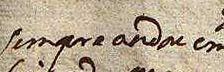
sempre andou em
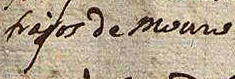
trajos de Mouro
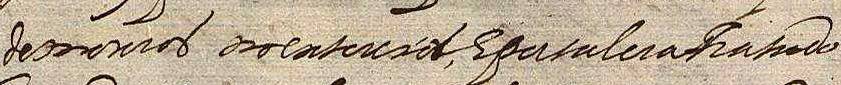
de mouros no exterior, E por tal era tratado
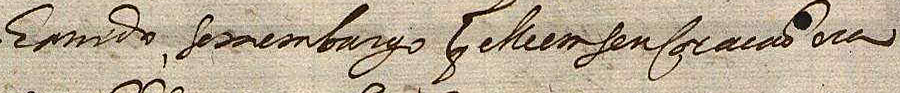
E auido, sem embargo q̄ elle em seu Coraçaõ era
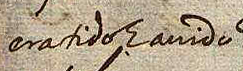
era tido E auido
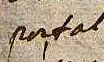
por tal
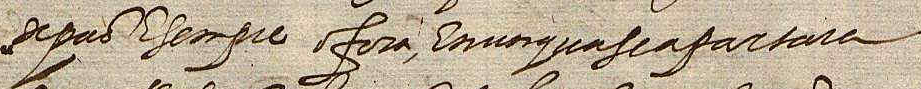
xpaõ E sempre o fora, E nunqua se apartara
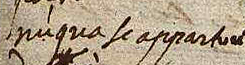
nūqua se appartou
